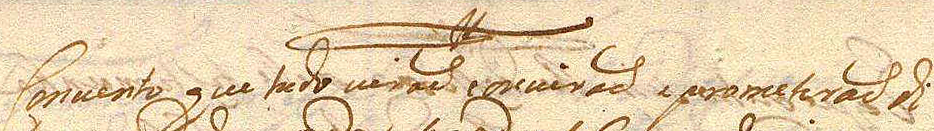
Conuento que tudo uiraõ e ouuiraõ, e prometeraõ di
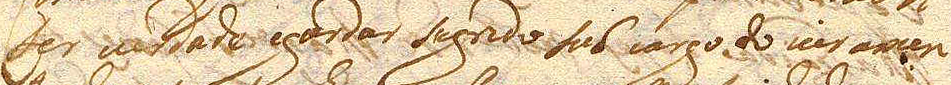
ser uerdade e gordar segredo sob cargo do iuramen
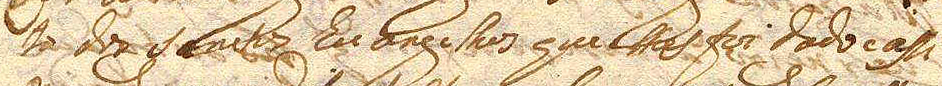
to dos sanctos Euangelhos que lhes foi dado e assi
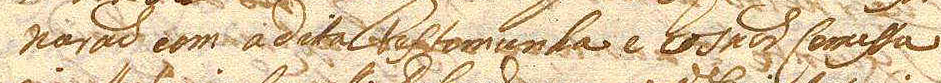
naraõ com a dita testemunha e o snor̄ Comissa
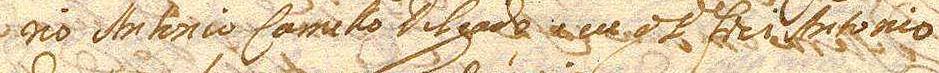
rio Antonio Camello Delgado, e eu o Pe frei Antonio
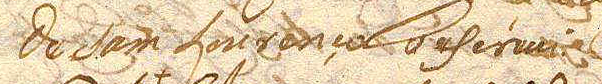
de Sam Lourenço o escreui
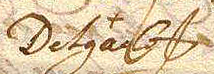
Delgado
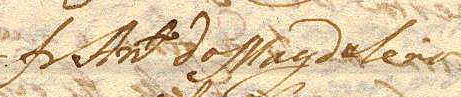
fr Anto da Magdalena
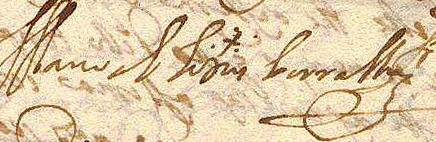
Manoel Lopes borralho
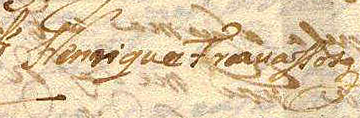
Henrique Trauassos
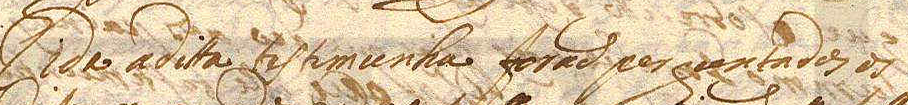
E ida a ditta testemunha foraõ perguntados os
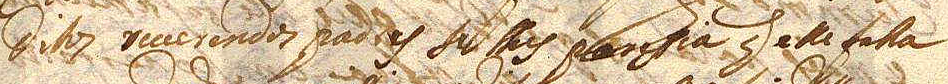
ditos reuerendos padres se lhes paressia q̄ elle falla
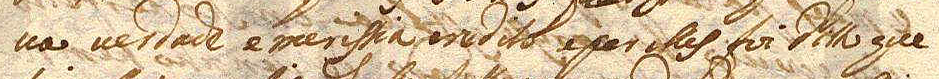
ua uerdade e meressia credito e por elles foi ditto que
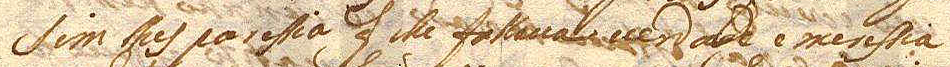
sim lhes paressia q̄ elle falaua uerdade, e meressia
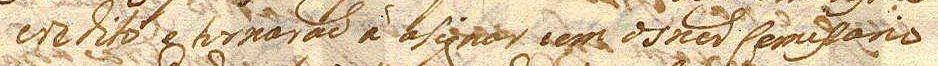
credito e tornaraõ a asignar com o snor Comissario
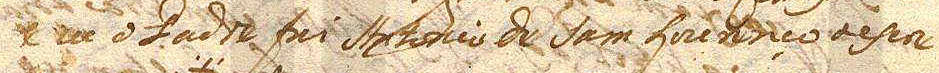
e eu o Padre frei Antonio de Sam Lourenço o escre
